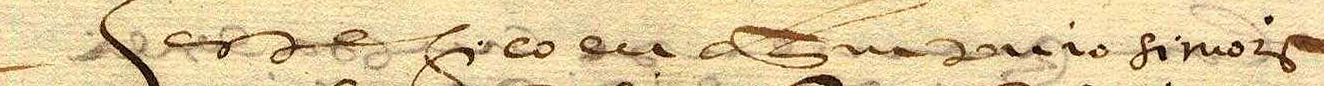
Sertefico eu Amtonio simois
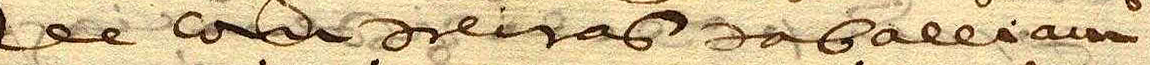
de contreiras taballiam
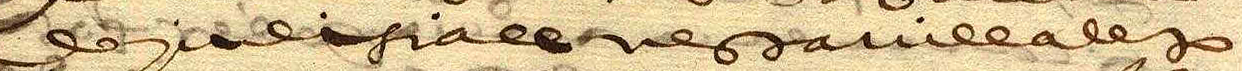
do judisiall nesta uilla de to
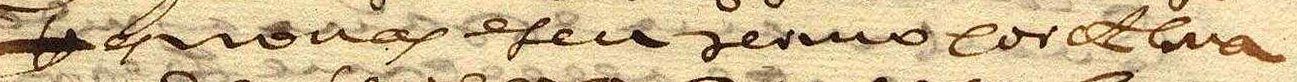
Res nouas e seu termo por Alua
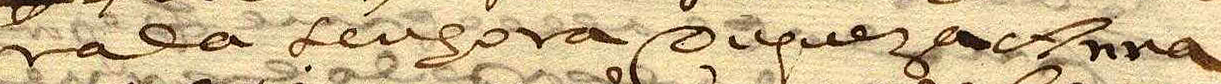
ra da senhora Duqueza Anna
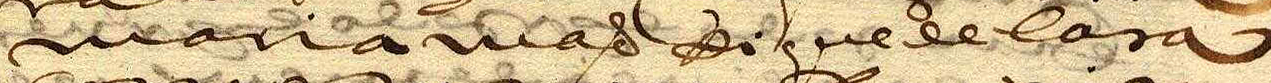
maria maõRique de lara
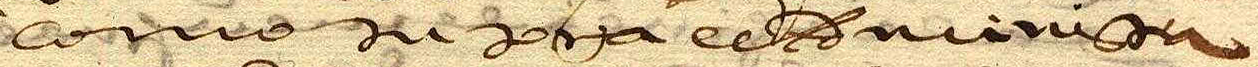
como tutora e Administra
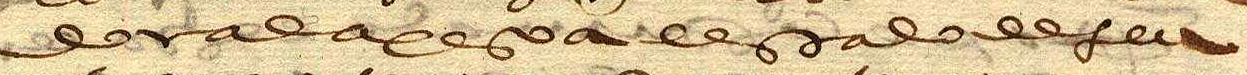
dora da pesoa e estado de seu
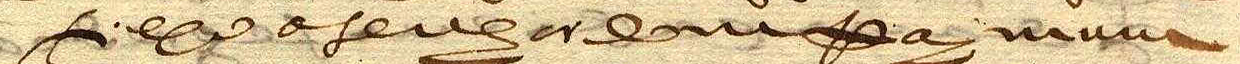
filho o senhor dom Rajmum
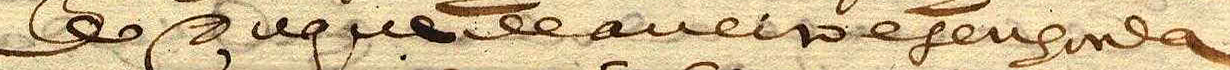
do Duque de aueiro e senhor da
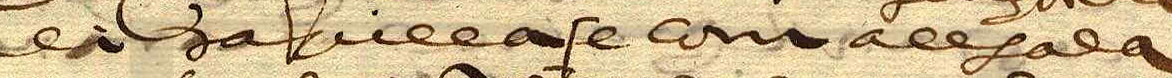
dita villa e com allsada
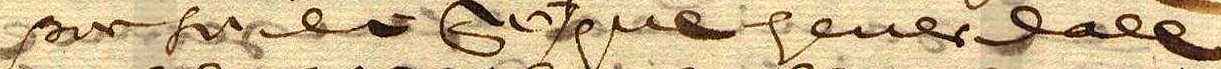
por fe diguo que he uerdade
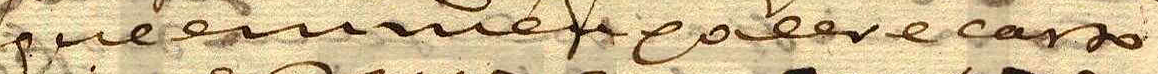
que em meu poder e carto
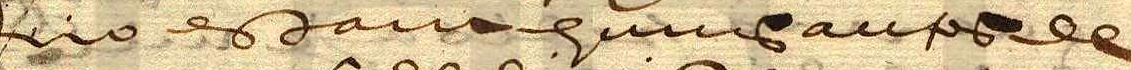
rio estam huns autos de
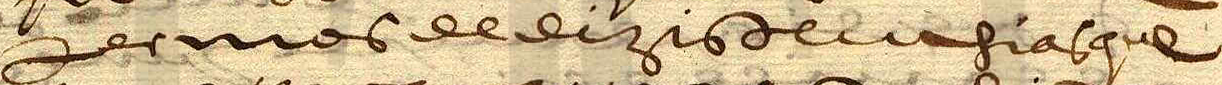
termos de dizistemsias que
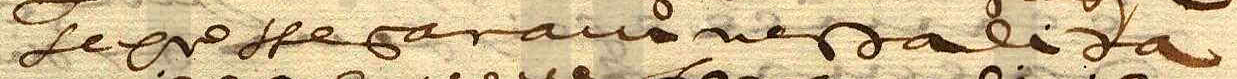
se prossesaram nesta dita
